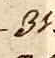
31.
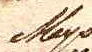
Mayo
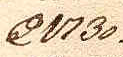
d̄ 1730.
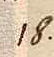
18.
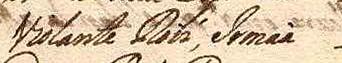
Violante Roiz̄, Irmaã
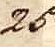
25
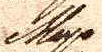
Mayo
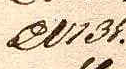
d̄ 1731.
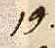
19.
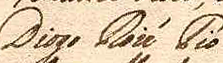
Diogo Roiz̄ Tio
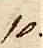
10.
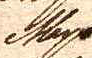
Mayo
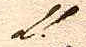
d.o
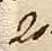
20.
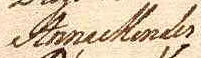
Anna Mendes
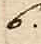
6.
